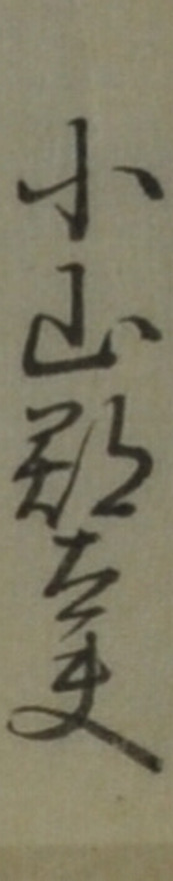小山郡太夫
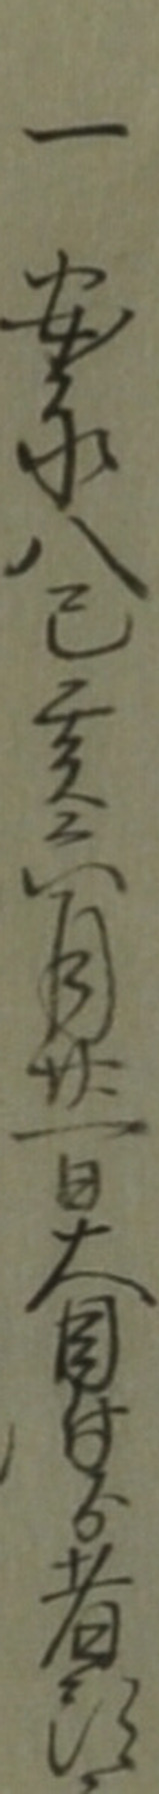一安永八己亥六月廿一日大目付ゟ者頭被仰付
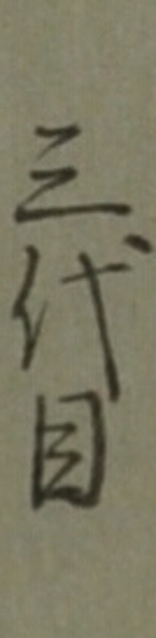三代目
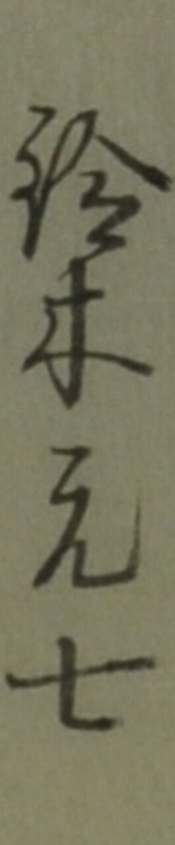鈴木元七
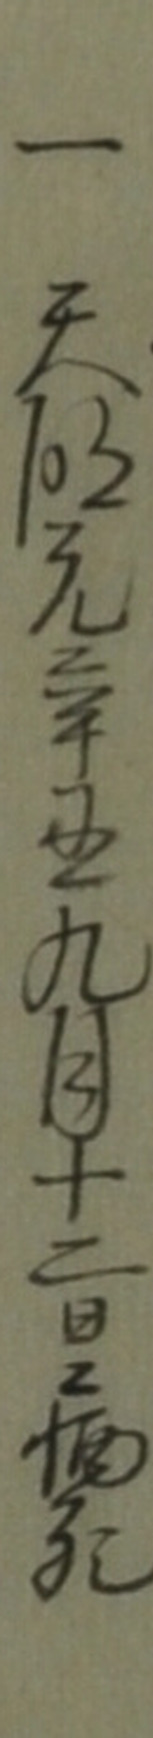一天明元辛丑九月十二日病死
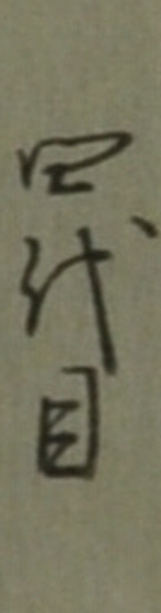四代目
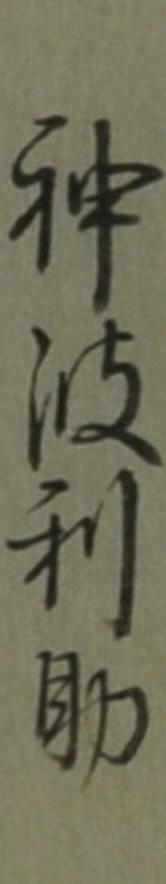神波利助
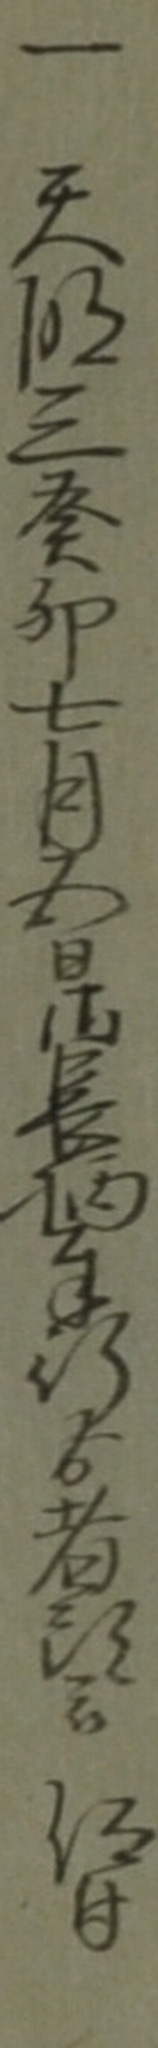一天明三癸卯七月五日御長柄奉行ゟ者頭被仰付
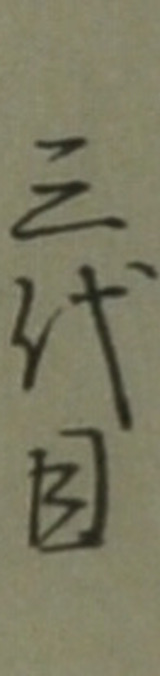三代目
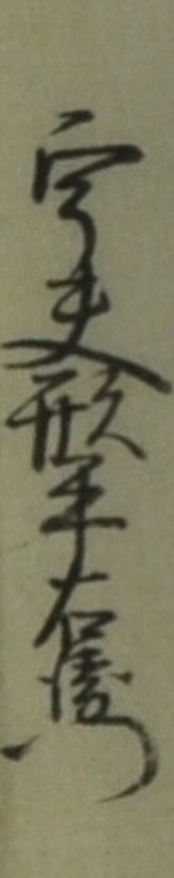宇夫形平右衛門

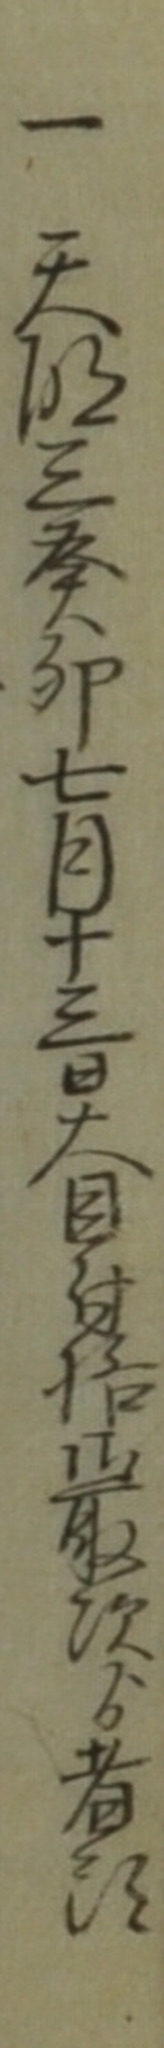一天明三癸卯七月十三日大目付格御取次ゟ者頭
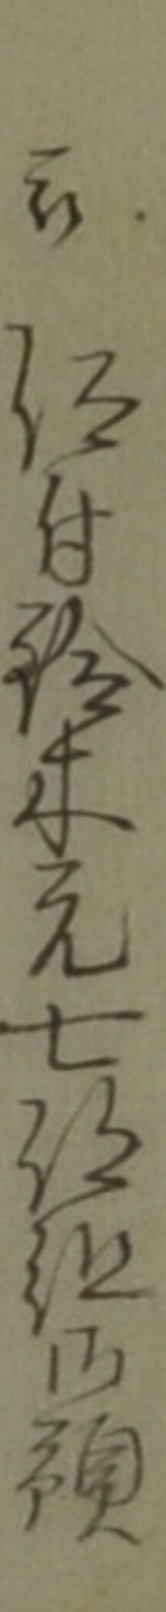被仰付鈴木元七跡組御預
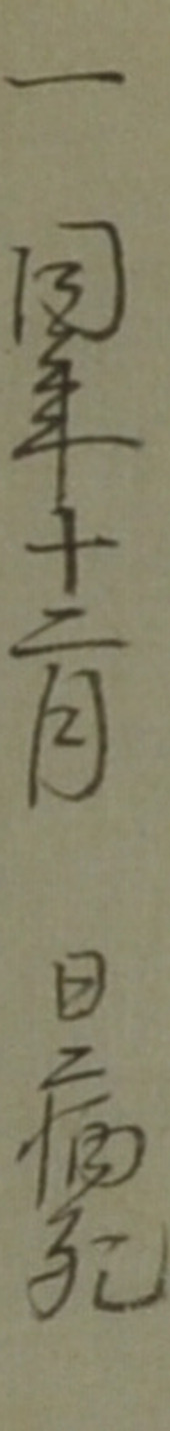一同年十二月日病死
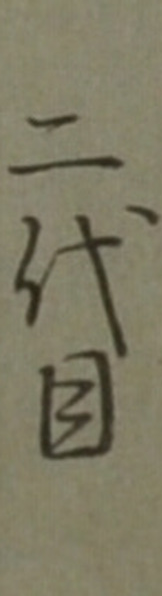二代目
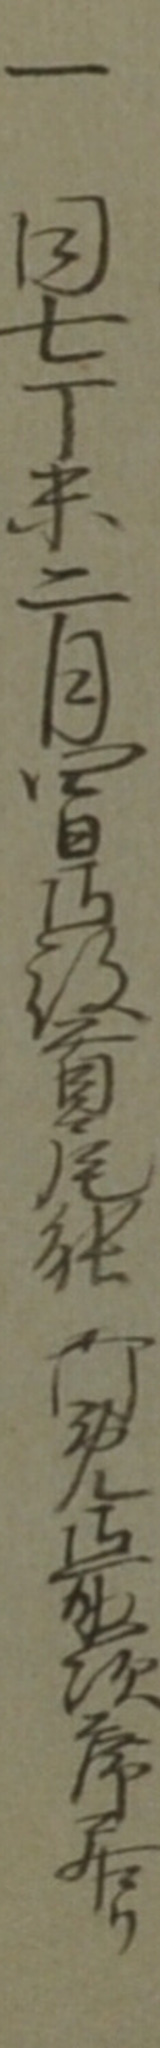一同七丁未二月四日御役首尾能御免御取次席居り
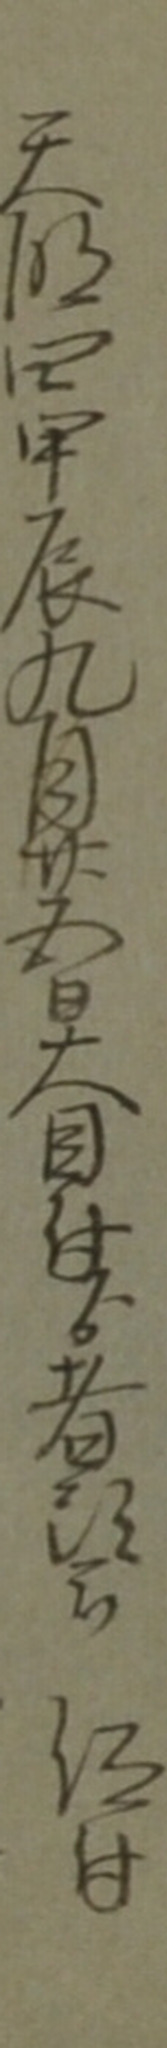一天明四甲辰九月廿五日大目付ゟ者頭被仰付
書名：諸御役代々録（二）
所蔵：伊那市立高遠町図書館・合同会社AMANE
